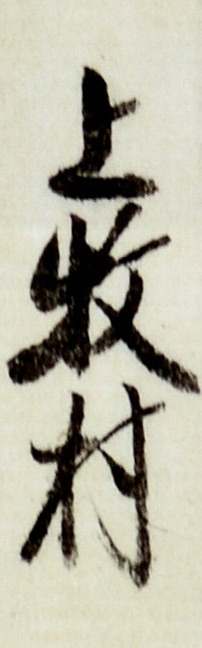上牧村
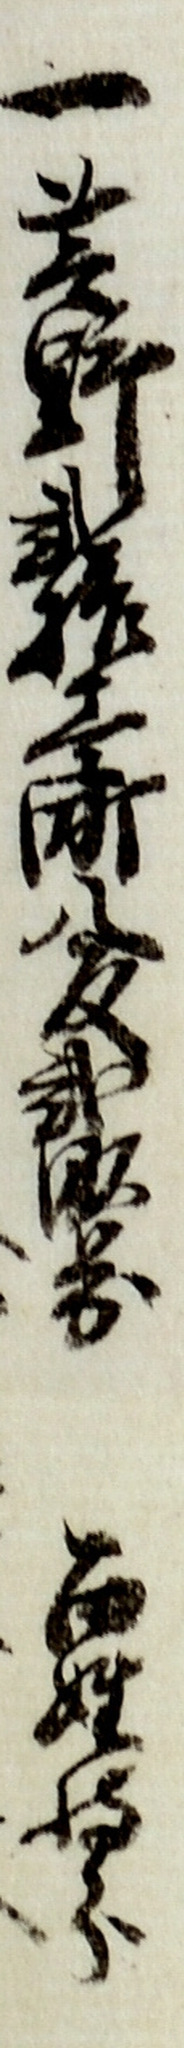一芝野弐拾壱町八反弐畝歩百姓持分
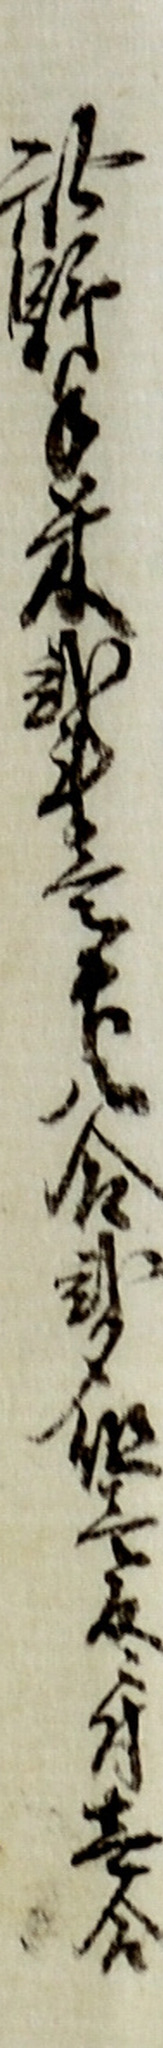此野手米弐斗壹升八合弐勺但壱反ニ付壱合
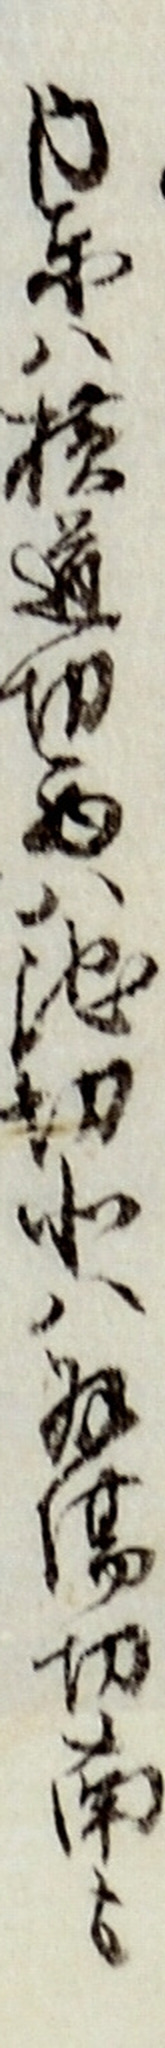内東ハ横道切西ハ池切北ハ羽場切南も
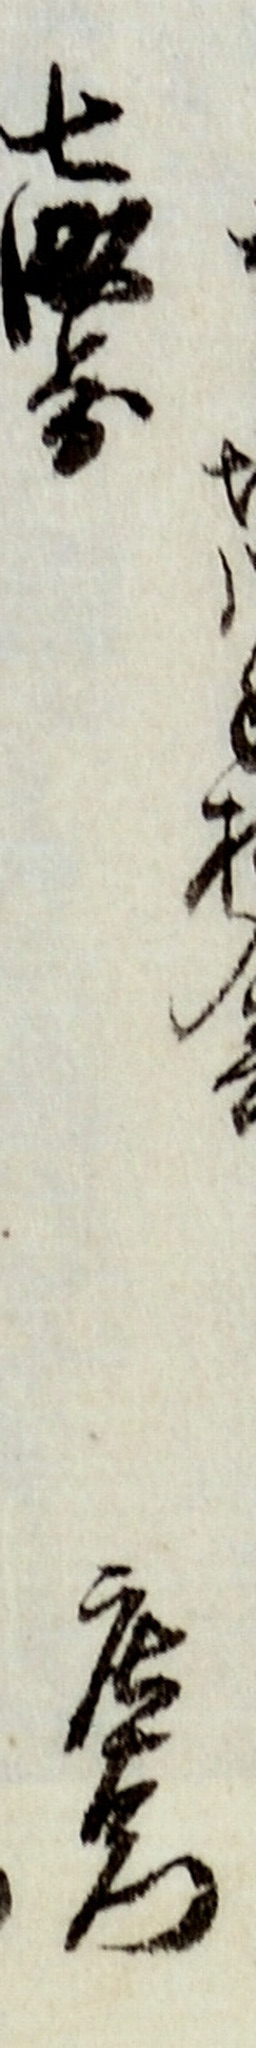七畝歩庄右衛門
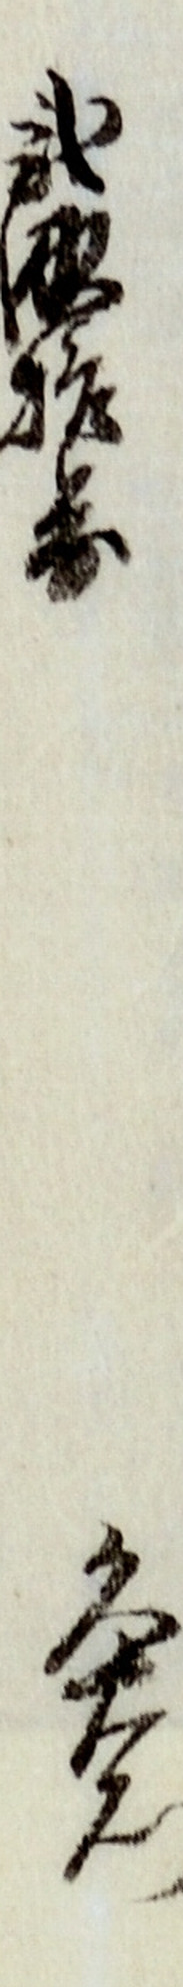弐畝拾歩久右衛門
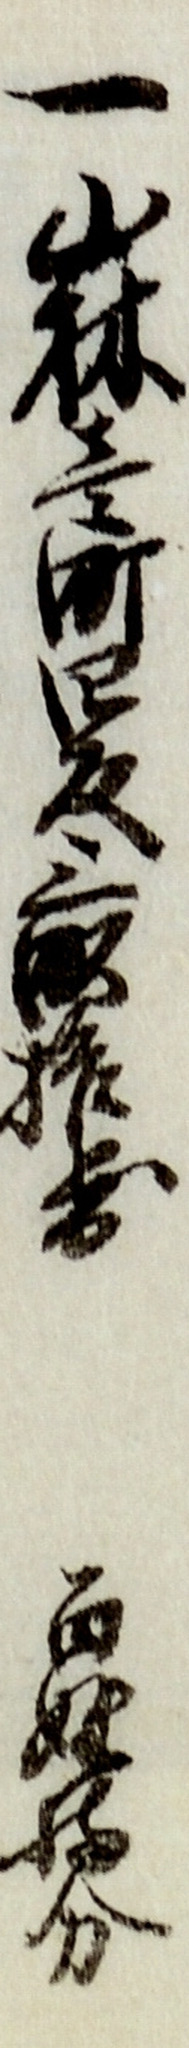一山林壱町四反三畝拾歩百姓持分
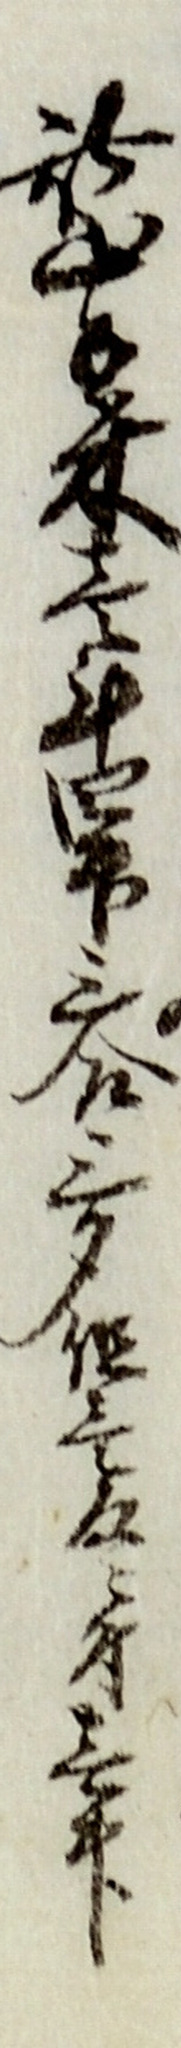此山手米壱斗四升三合三勺但壱反ニ付壱升
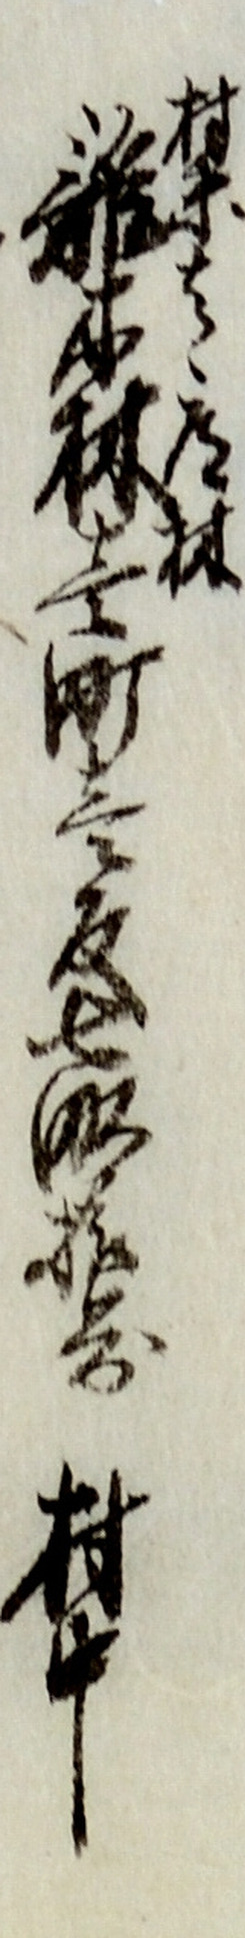雑木林壱町壱反七畝拾歩村中
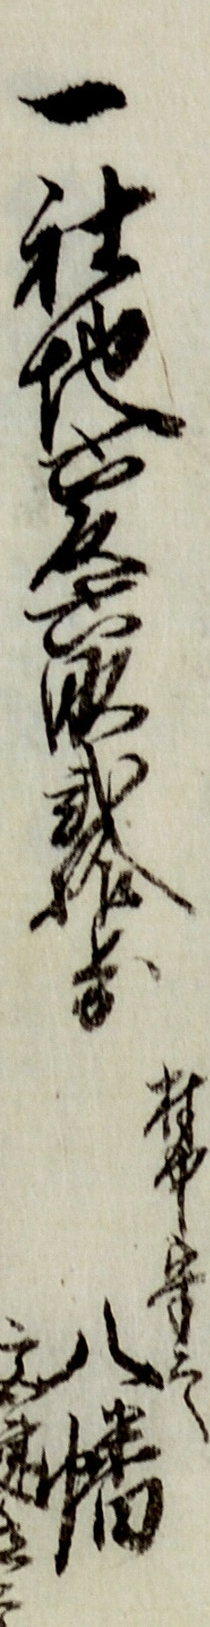一社地六反六畝弐拾歩八幡
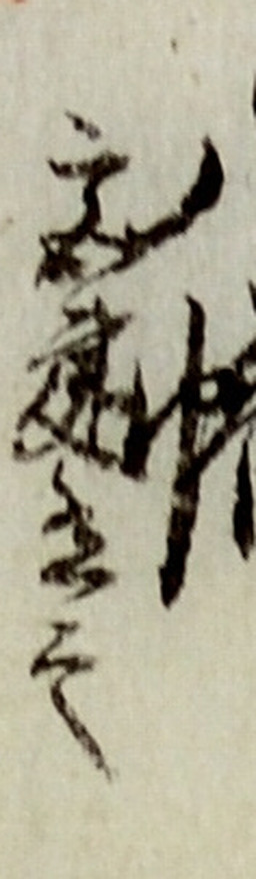宮建有之

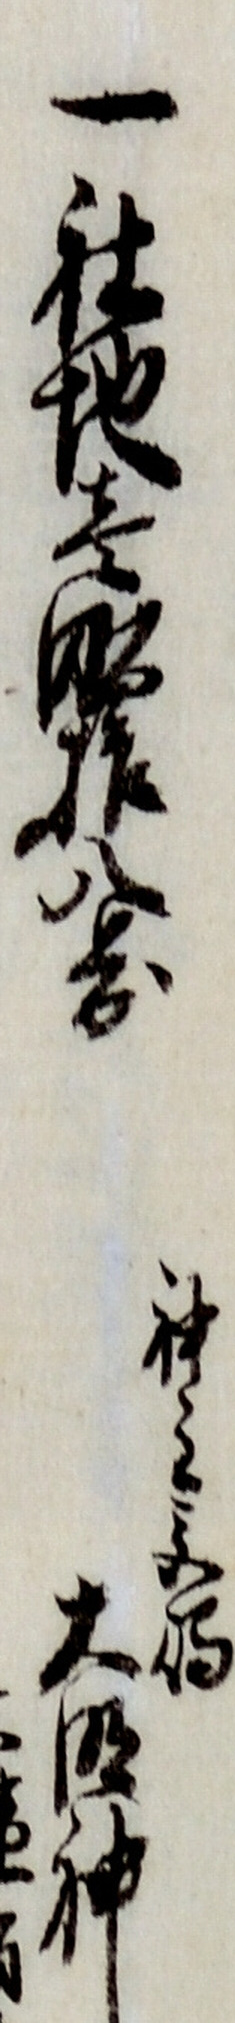一社地一畝拾八歩大明神
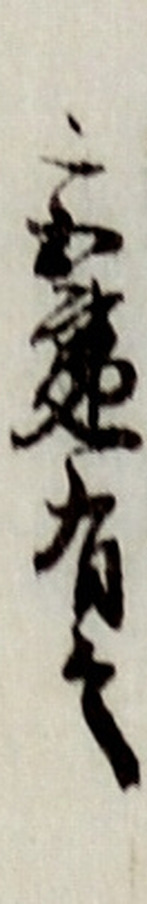宮建有之
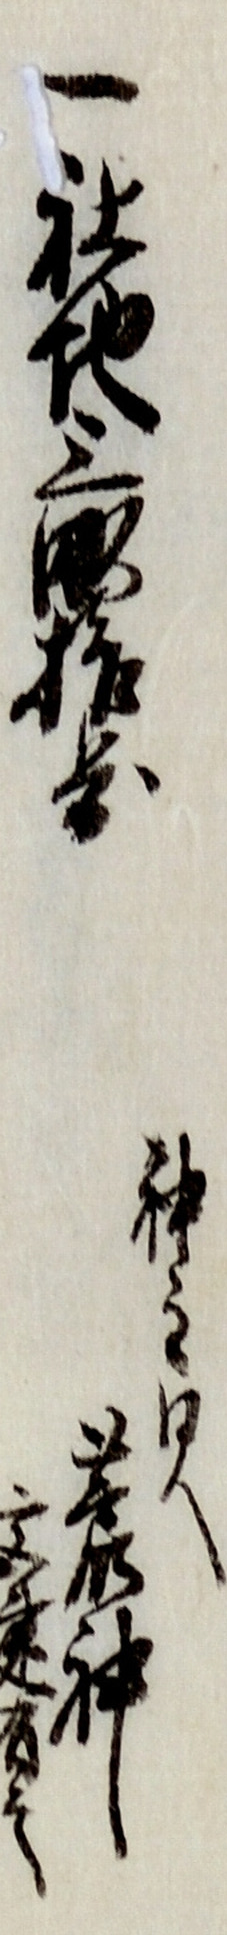一社地三畝拾歩荒神
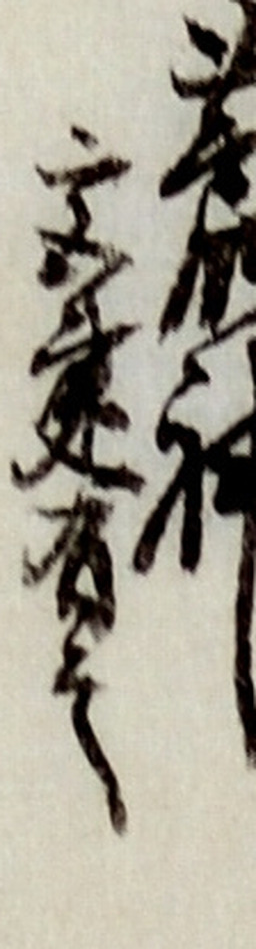宮建有之
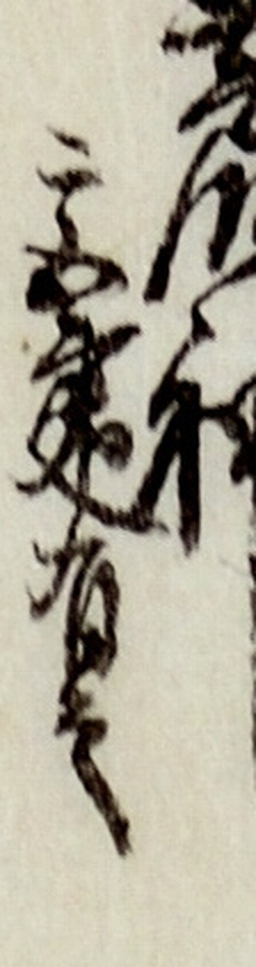宮建有之
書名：御領分中山林社地手控
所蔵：伊那市立高遠町図書館・合同会社AMANE
